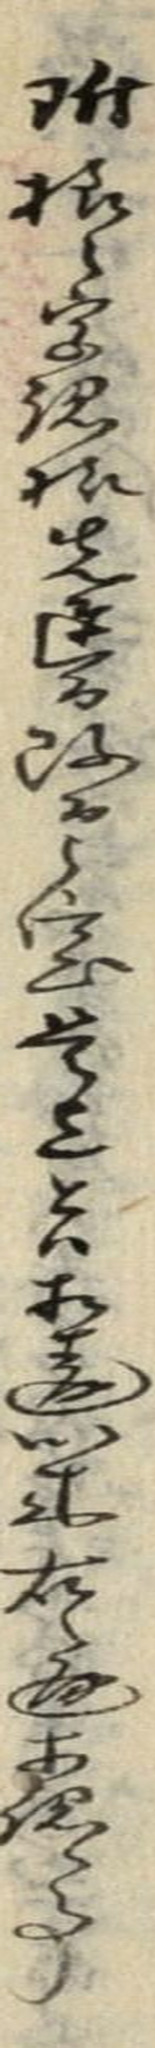附様之字認様先達而改而被仰出是迄とは相違以来右之通相認候事
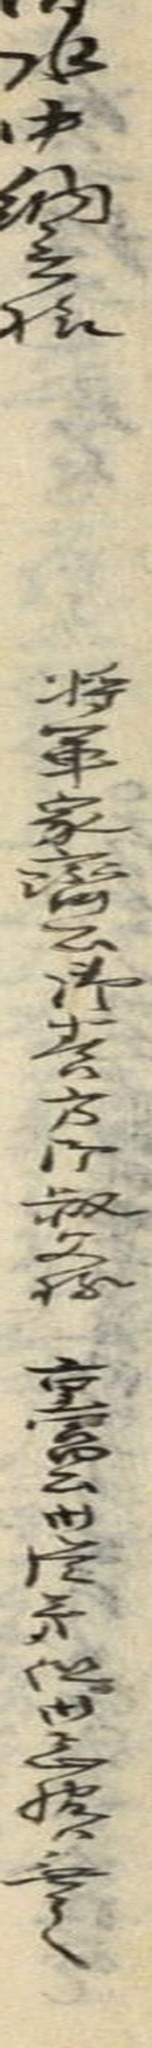一清水中納言様将軍家斉公御養方御叔父様重冨公御従弟但御忌服は無之
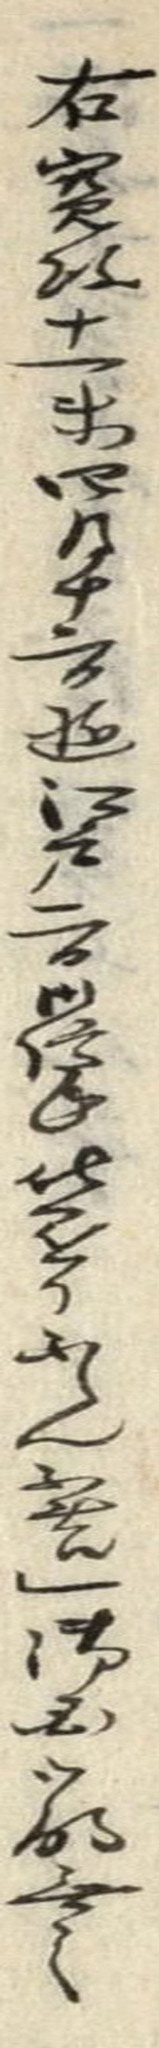右寛政十一未四月十二日逝江戸二日御停止仕懸りふしん不苦」御国御触無之
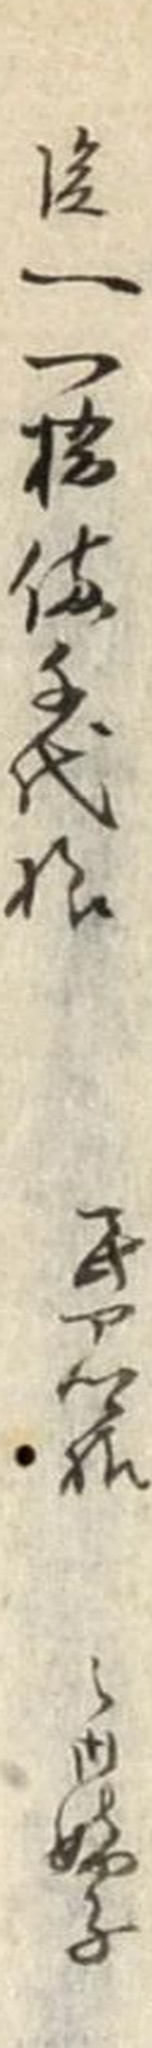一一橋備千代様民部卿様之御嫡子
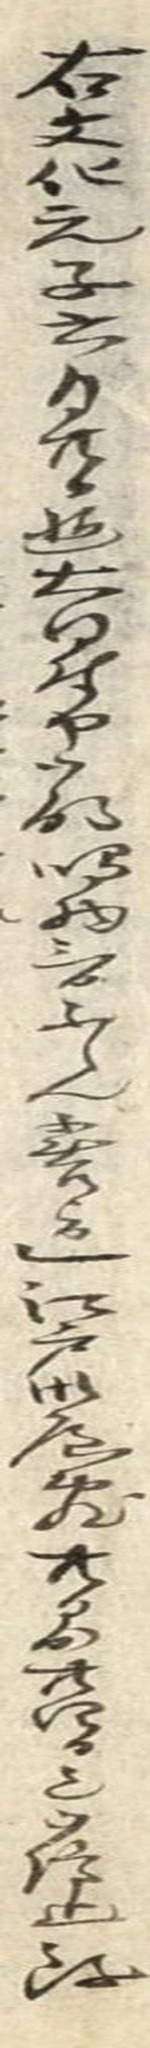右文化元子六月廿日逝大目付中御触鳴物三日ふしん不苦旨」江戸御屋敷廿日ゟ廿四日迄御停止致
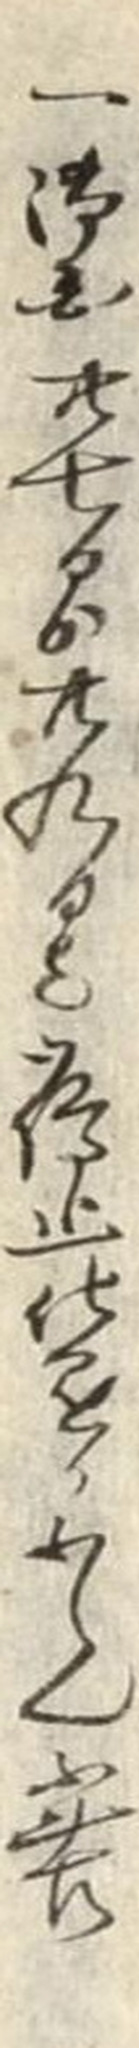一御国廿七日ゟ廿九日迄御停止仕懸りふしん不苦

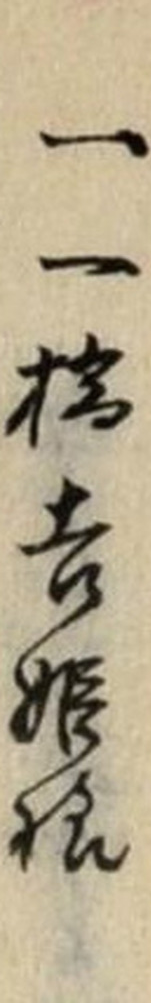一一橋儀同様
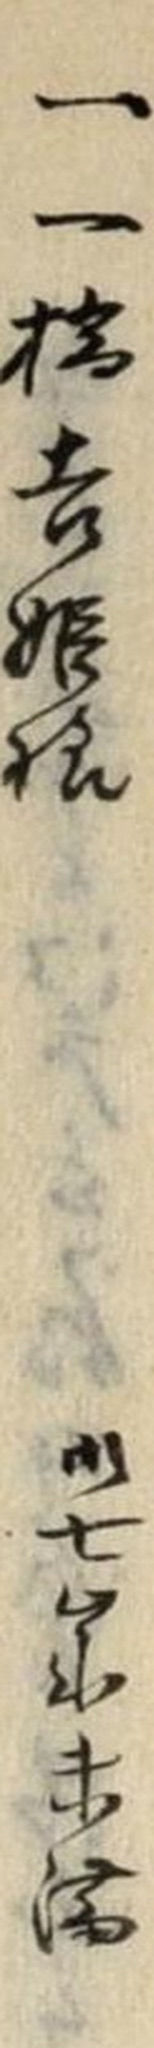一一橋吉姫様御七歳未満
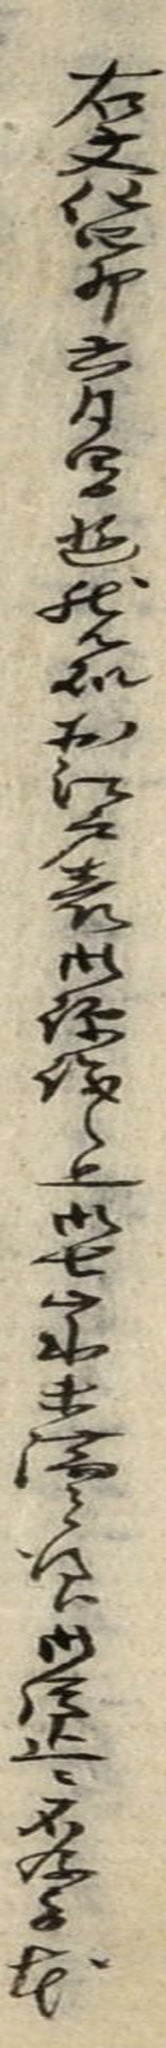右文化四卯六月四日逝然る処於江戸表御評議之御七歳未満に候得は御停止に不及旨本
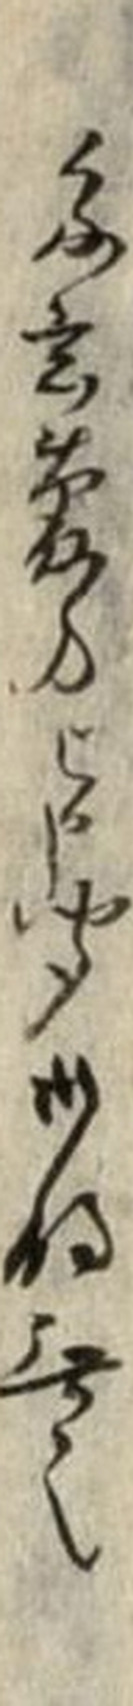多玄蕃方被申聞御触無之
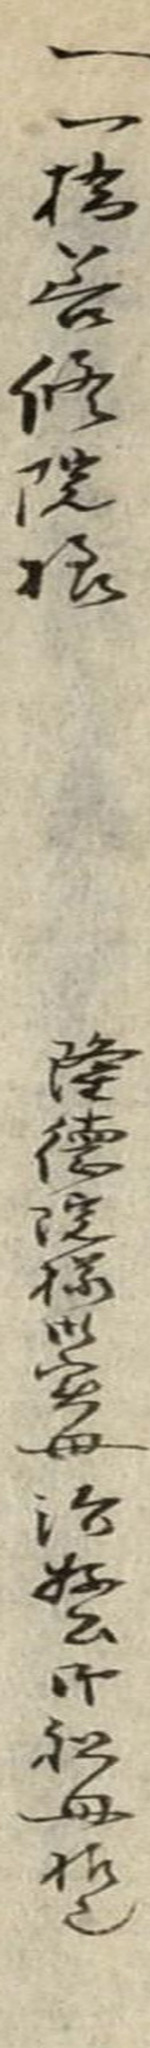一一橋善修院様隆徳院様御実母治好公御祖母様也
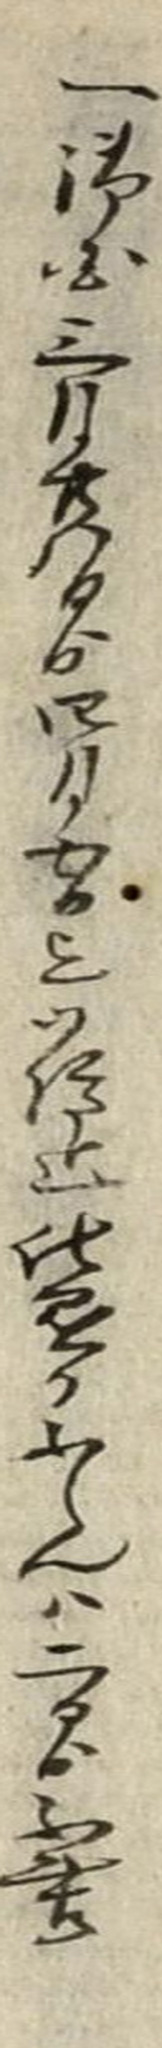一御国三月廿八日ゟ四月五日迄御停止仕懸りふしんは二日ゟ不苦
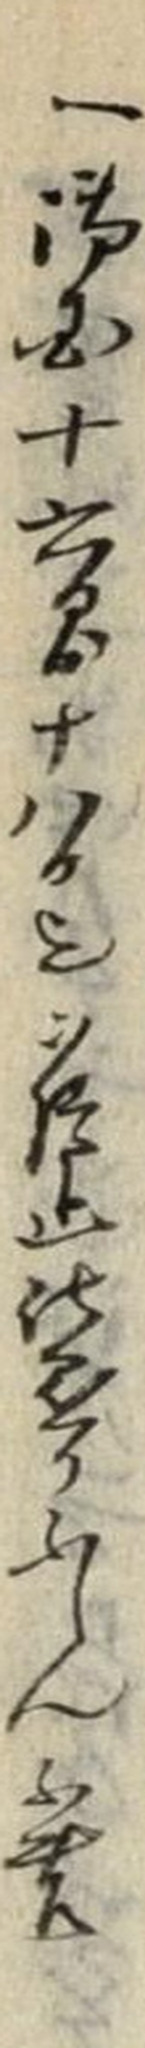一御国十六日ゟ十八日迄御停止仕懸り普請不苦
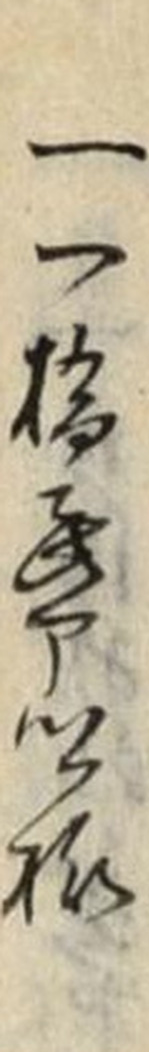一一橋民部卿様
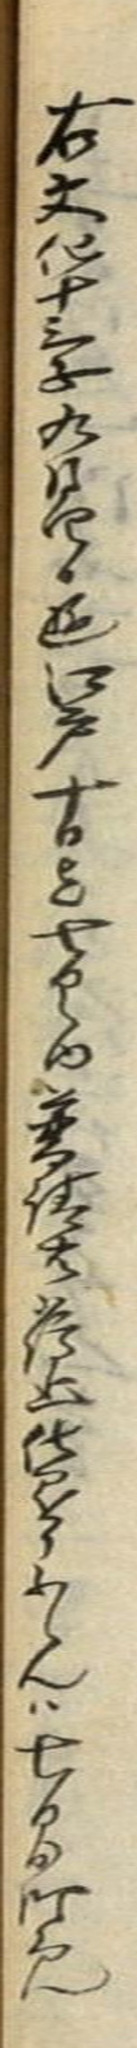右文化十三子九月四日逝江戸十日迄七日之内普請共御停止仕懸りふしんは七日ゟ御免
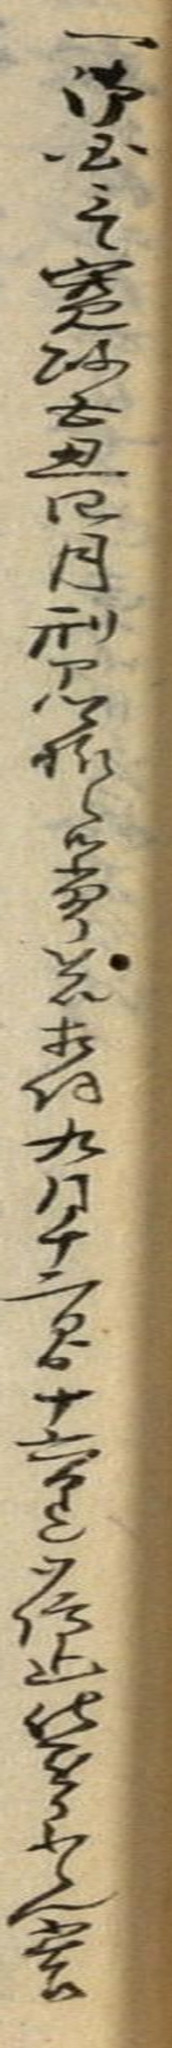一御国にて寛政五丑四月刑部卿様之御当りを以相伺九月十二日ゟ十六日迄御停止仕懸りふしん不苦
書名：御停止異変死失
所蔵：福井県文書館 Fukui Prefectural Archives
